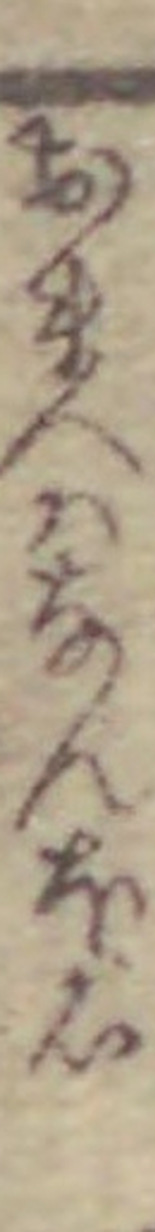おまへはなんほ心
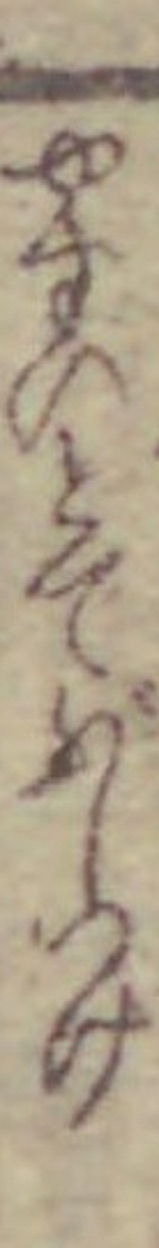やすいとてぶしつけ
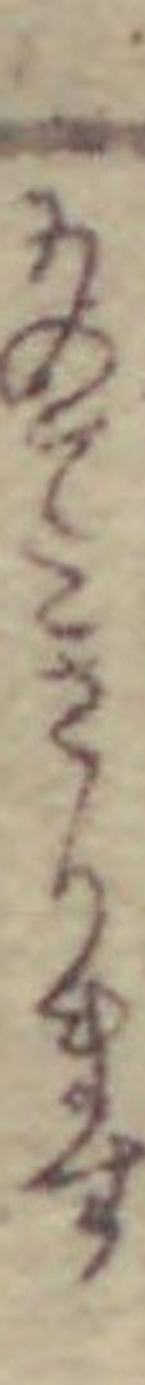ものてこさります
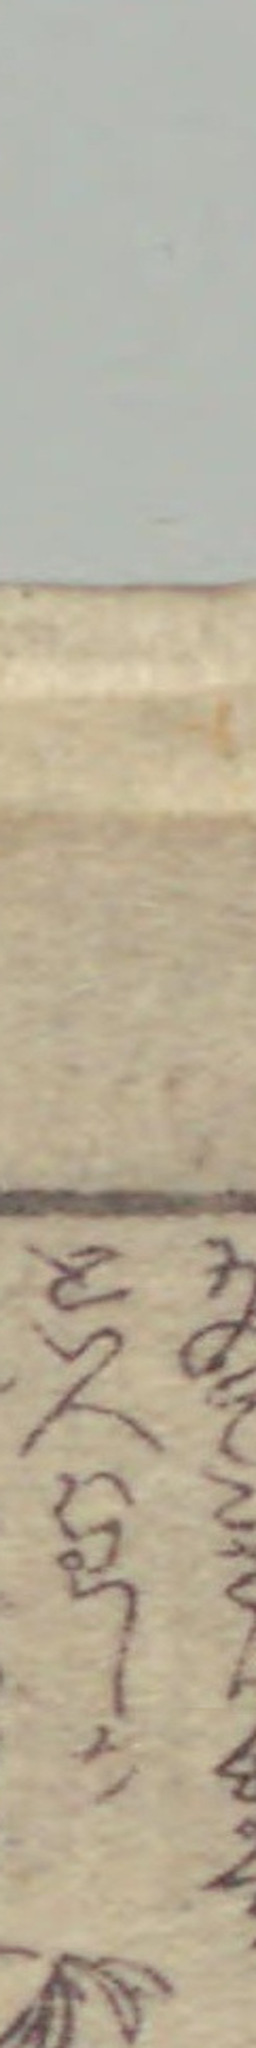といへはわしか
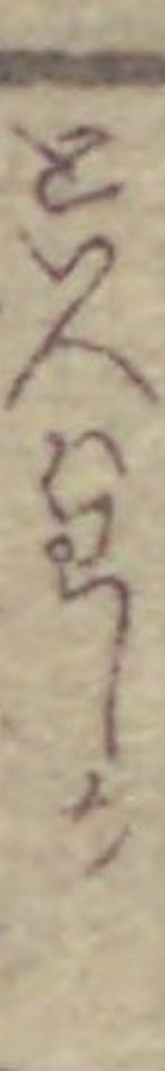といへはわしか
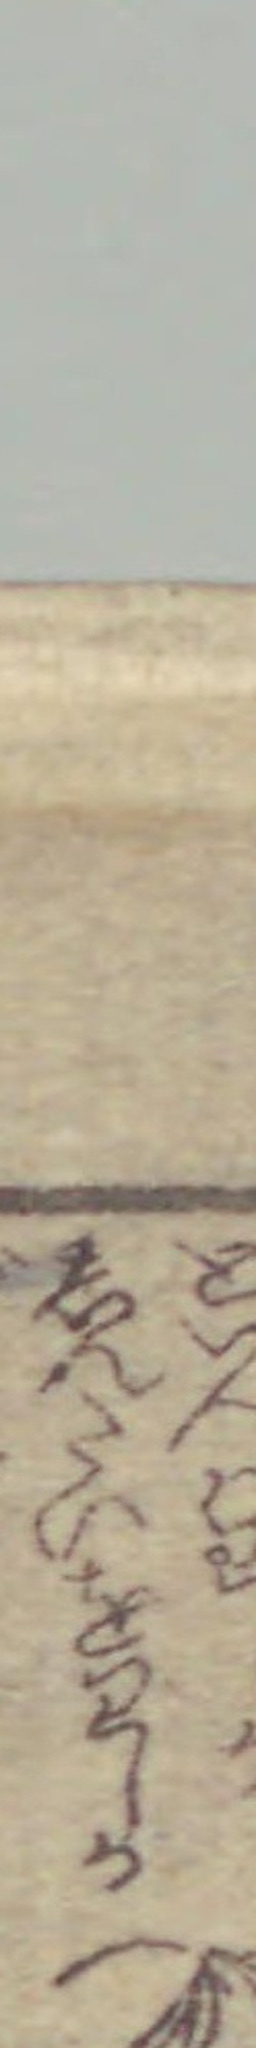しんたいをわしか
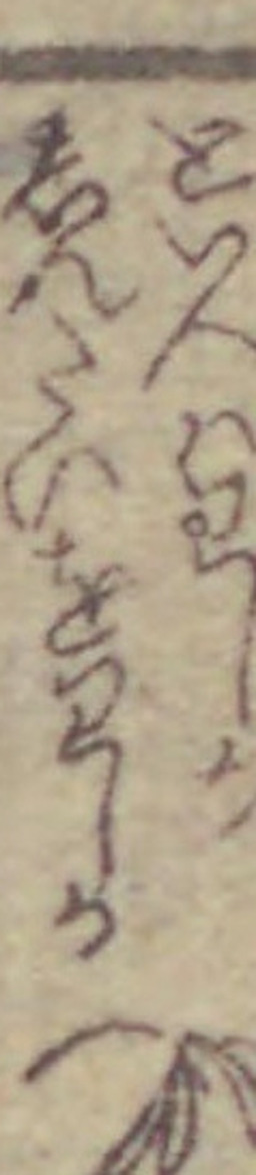しんたいをわしか
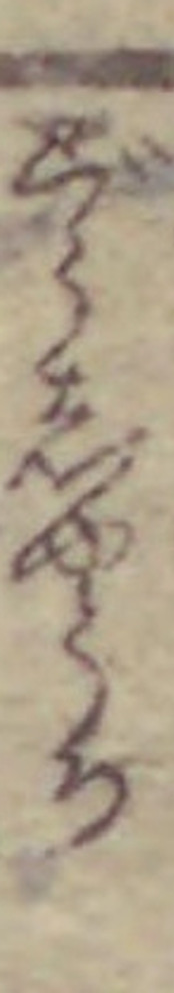どうしやうか
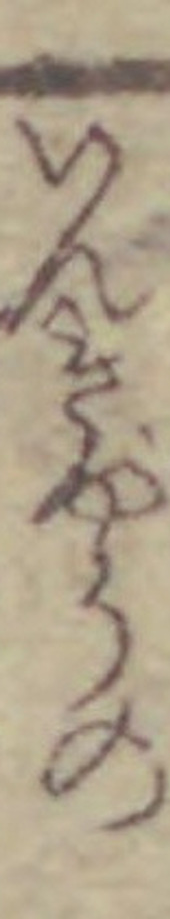いんきやうの
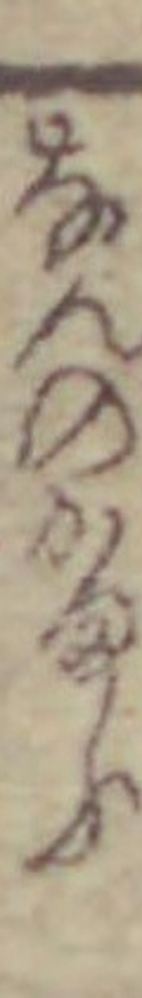なんのかまふ
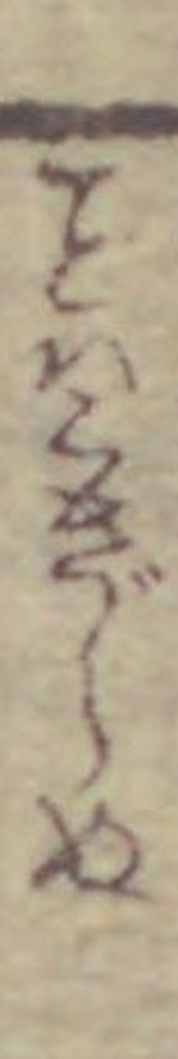ことはこざらぬ
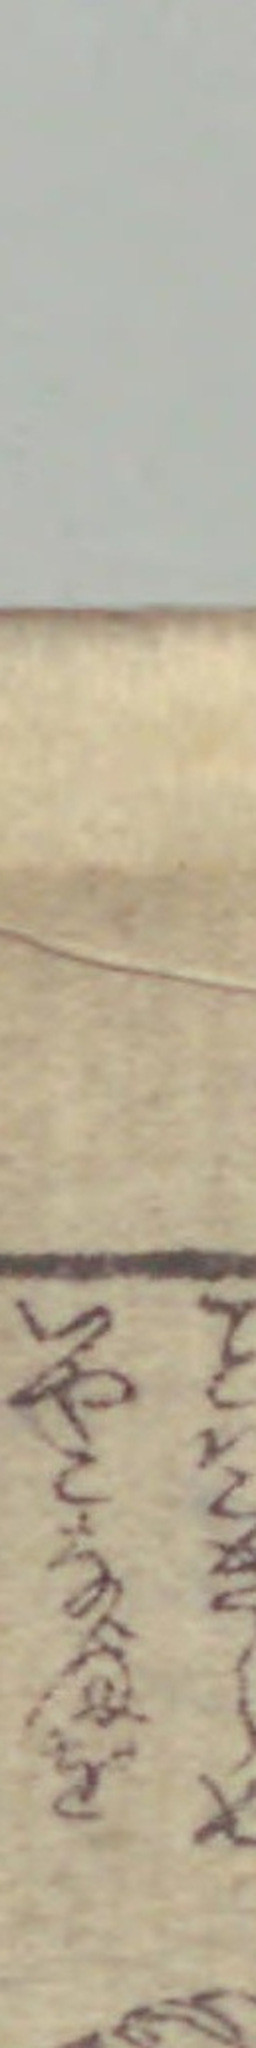いやこなさまを
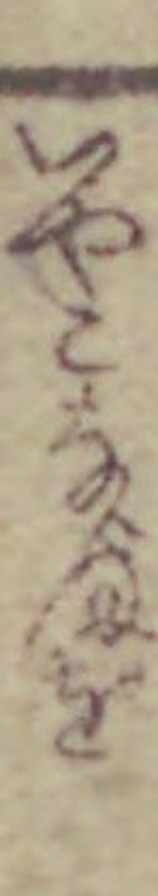いやこなさまを
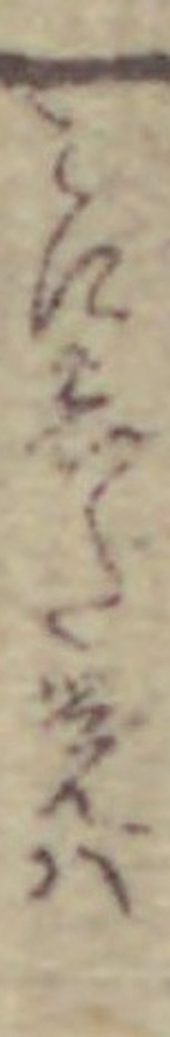こにした覚は
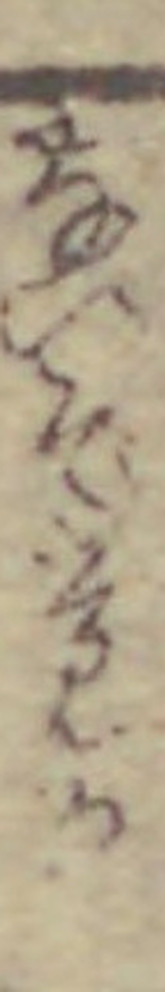ないぞ覚か
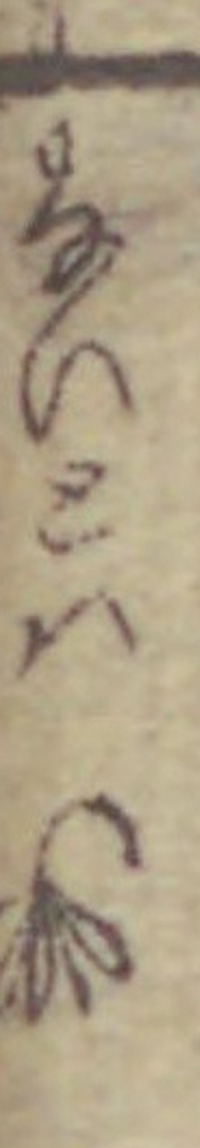ないとは
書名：思事夢濃枕 3巻
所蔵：国立国会図書館 National Diet Library, JAPAN
